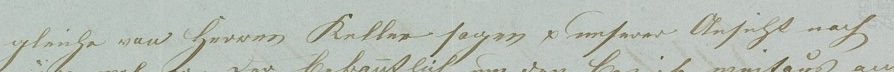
gleiche von Herren Keller sagen & unserer Ansicht nach
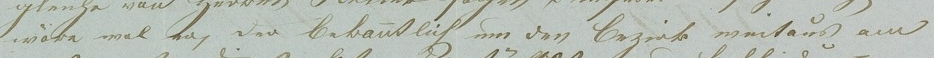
wäre wol er, der bekanntlich um den Bezirk weitaus am
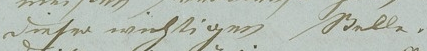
dieser wichtigen Stelle.
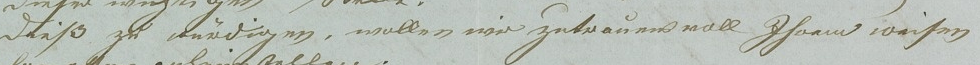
Dieß zu würdigen, wollen wir zutrauensvoll Ihrem weisen
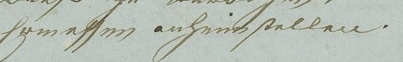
Ermessen anheimstellen.
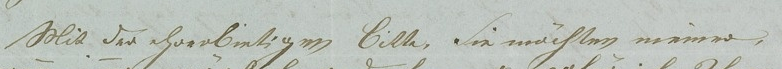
Mit der ehrerbietigen Bitte, Sie möchten meiner,
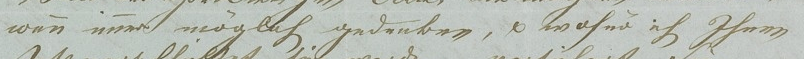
wenn immer möglich gedenken, & wofür ich Ihnen
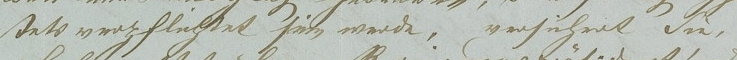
stets verpflichtet sein werde, versichert Sie,
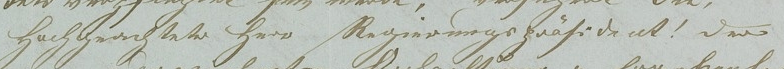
Hochgeachteter Herr Regierungspräsident! der
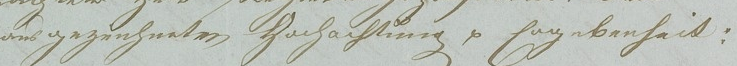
ausgezeichneten Hochachtung & Ergebenheit:
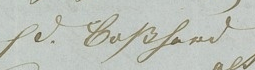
Ed. Boßhard
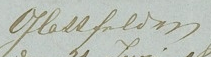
Glattfelden
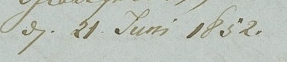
d. 21 Juni 1852.
